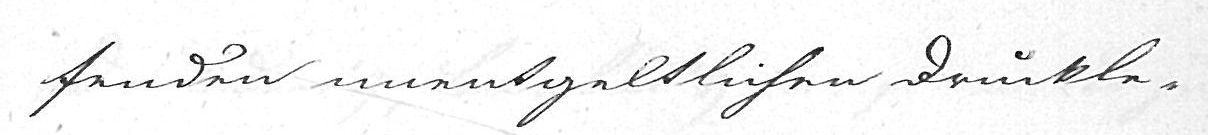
fenden unentgeltlichen Druckle-
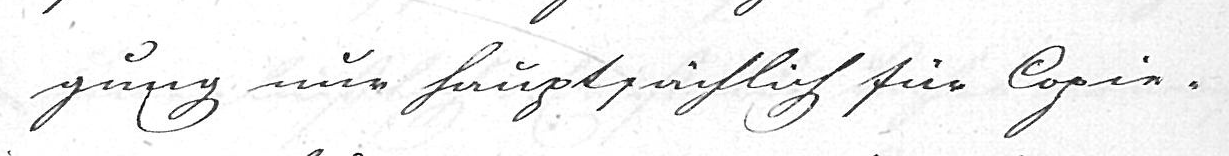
gung nur hauptsächlich für Copie-
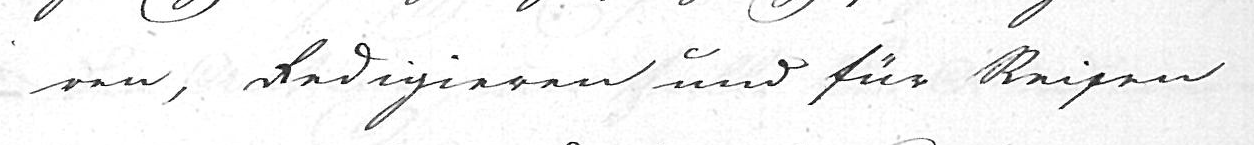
ren, Redigieren und für Reisen
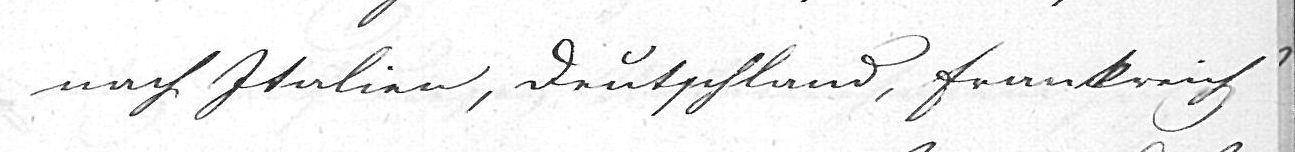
nach Italien, Deutschland, Frankreich
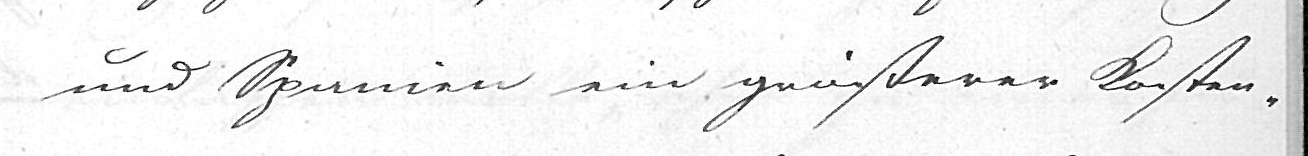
und Spanien ein größerer Kosten-
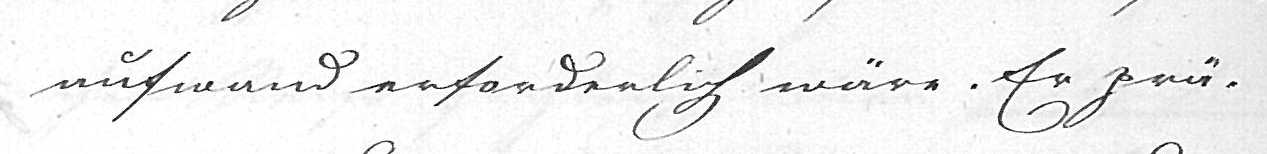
aufwand erforderlich wäre. Er prä-
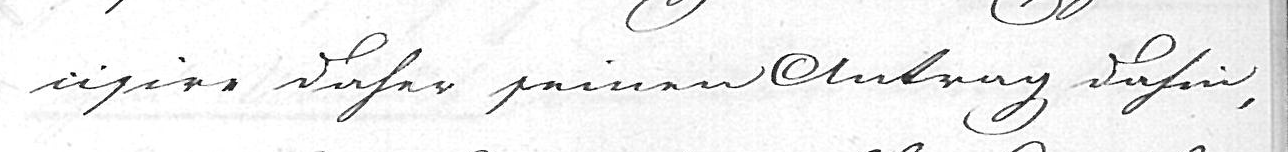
cisire daher seinen Antrag dahin,
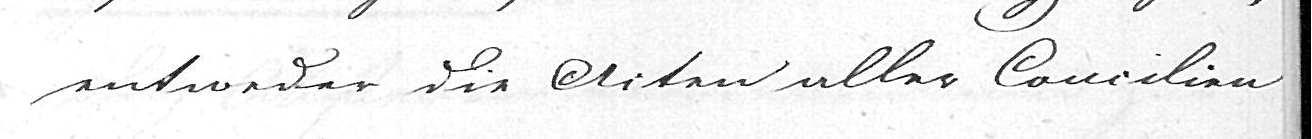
entweder die Acten aller Concilien
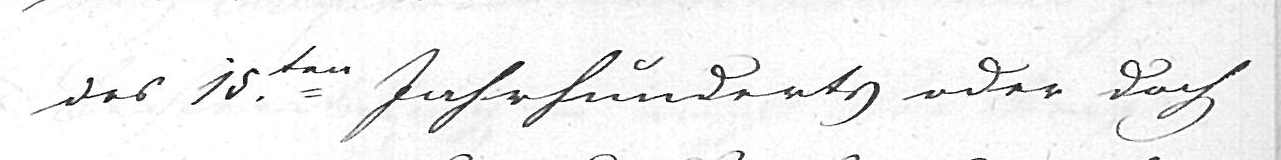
des 15ten Jahrhunderts oder doch
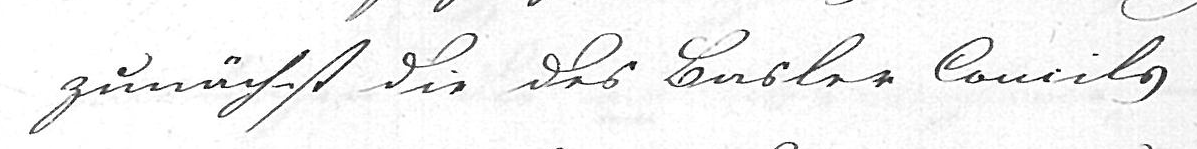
zunächst die des Basler Concils
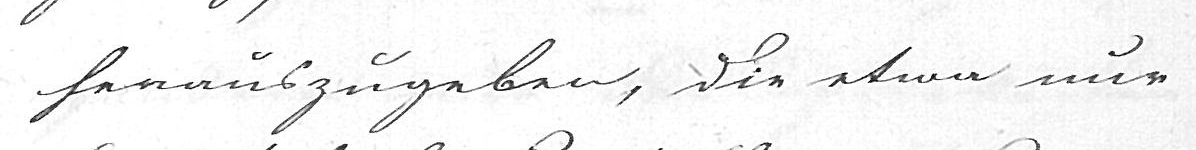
herauszugeben, die etwa nur
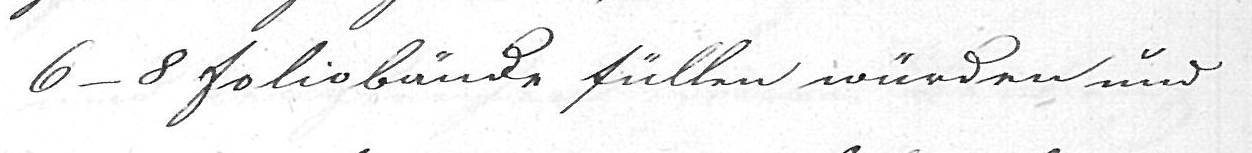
6-8 Foliobände füllen würden und
